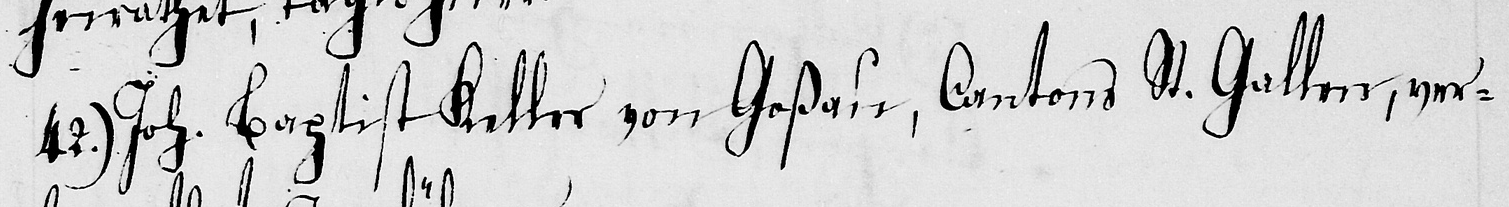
42.) Joh. Baptist Keller von Goßau, Cantons St. Gallen, ver¬
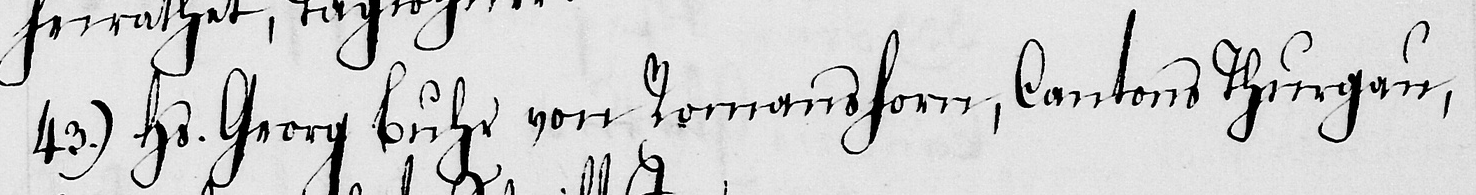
43.) Hs. Georg Buhr vom Romanshorn, Cantons Thurgau,
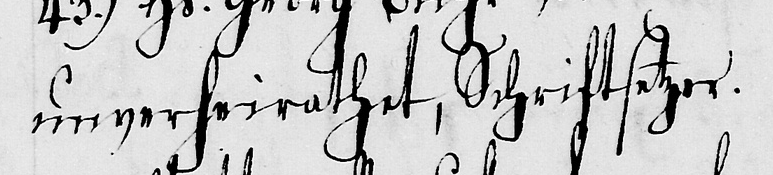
unverheirathet, Schriftsetze¬
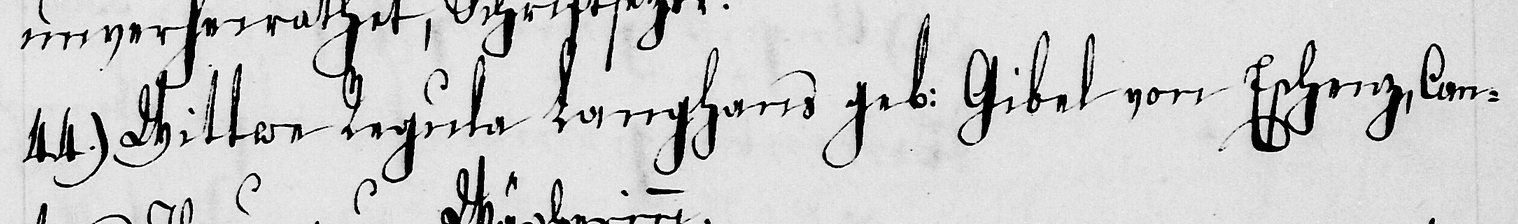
44.) Wittwe Regula Langhans geb: Gibel von Eschenz, Can¬
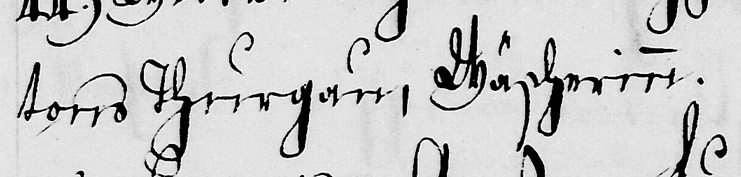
tons Thurgau, Wäscherinn.
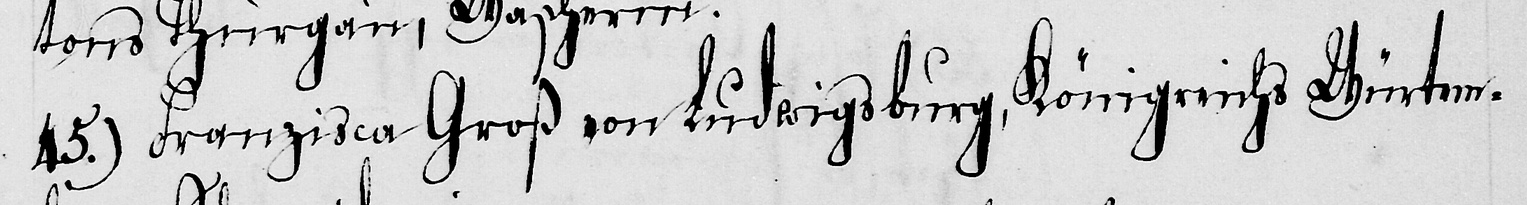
45.) Franzisca Groß von Ludwigsburg, Königreichs Würtem¬
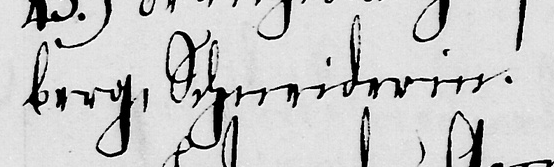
berg, Schneiderin.
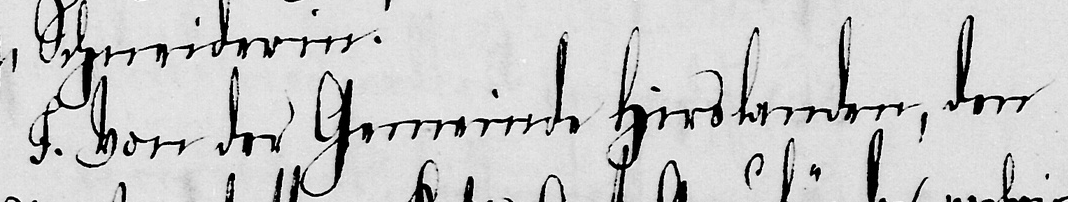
F. Von der Gemeinde Hirslanden, den
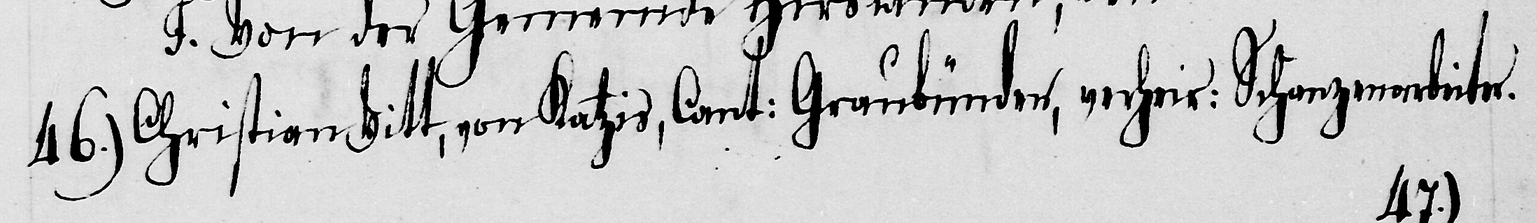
46.) Christian Vitt, von Katzis, Cant: Graubünden, verheir: Schanzenarbeite¬
